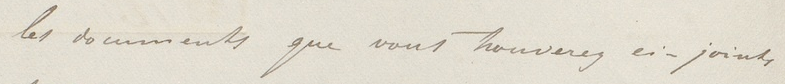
les documents que vous trouverez ci-joints
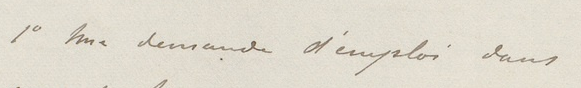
1o Une demande d'emploi dans
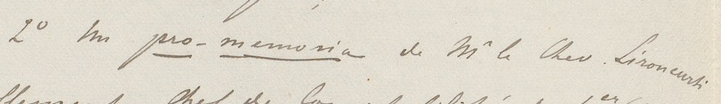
2o Un pro-memoria de Mr le Chev. Lironcurti
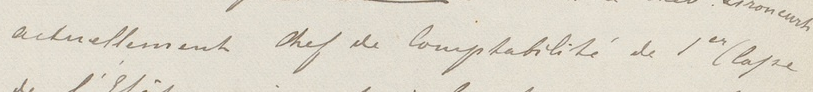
actuellement Chef d Comptabilité de 1er Classe
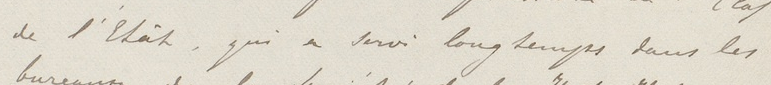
de l'Étât, qui a servi longtemps dans les
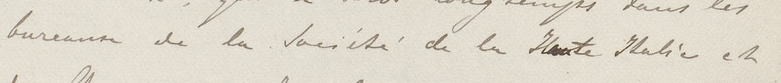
bureaux de la Société de la Haute Italie et
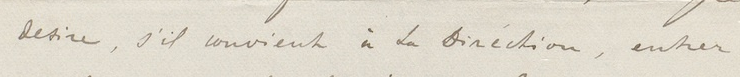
desire, s'il convient à la Diréction, entrer
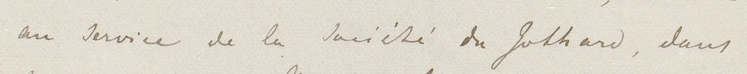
au service de la société du Gothard, dans
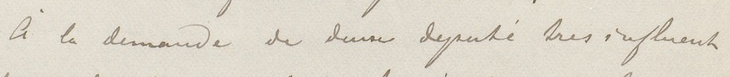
À la demande de deux deputé tres influent
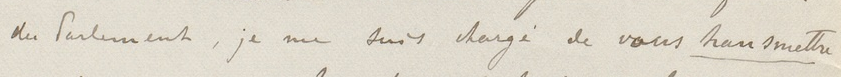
du Parlement, je me suis chargé de vous transmettre
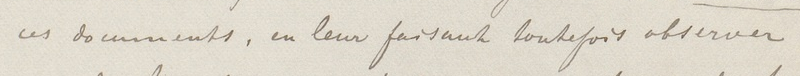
ces documents, en leur faisant toutefois observer
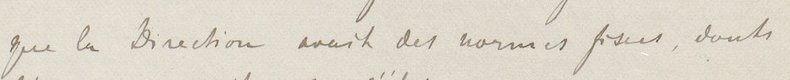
que la Direction avait des normes fixes, donts
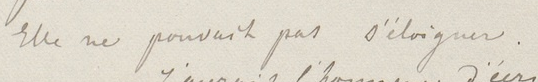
Elle ne pouvait pas s'éloigner.
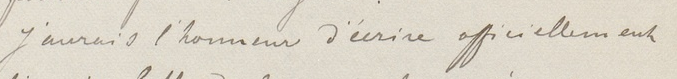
J'aurais l'honneur d'écrire officiellement
